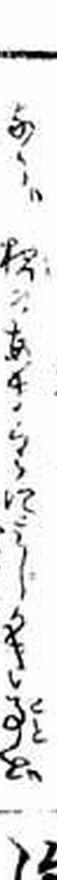なり夜のあまにみじかき事を
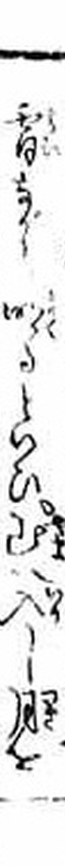宵ながら明るといひ山へ入し月を養
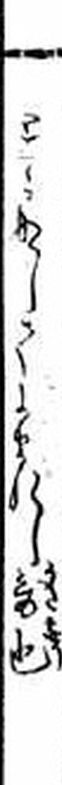ともなしてよまれし哥也父
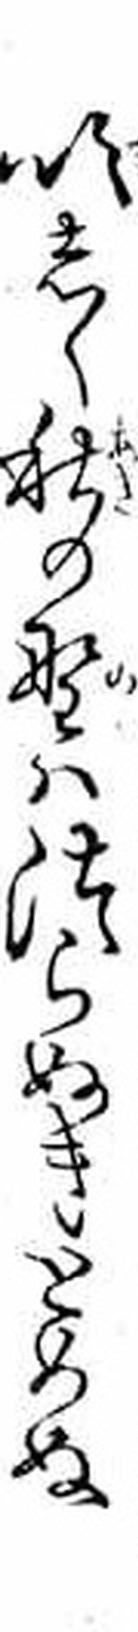吹しく秋の野はつらぬきとめぬ
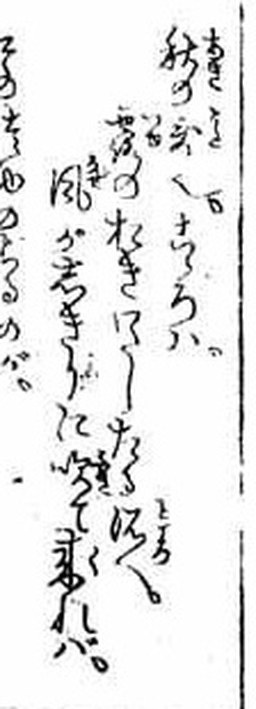露のおきわたしたる所へ文
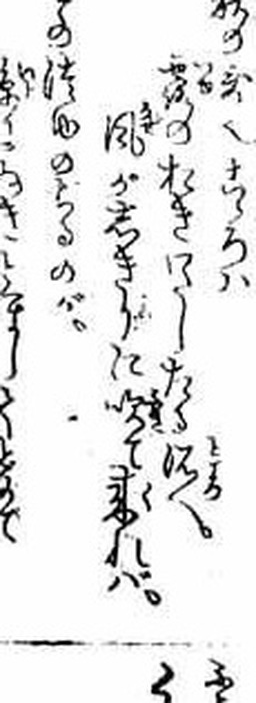風がしきりに吹て来れば
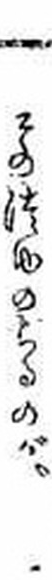そのつゆのちるのが屋
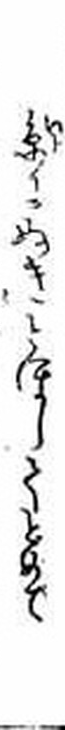糸にぬきことほしてとめて
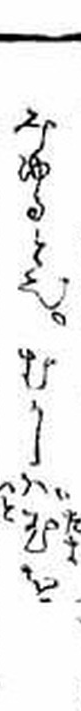みゆると也むかしは玉を
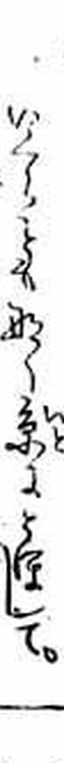いくらともなく糸にとほして朝
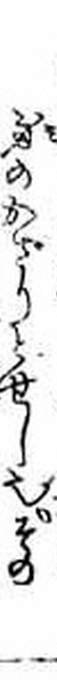身のかざりとせし也その
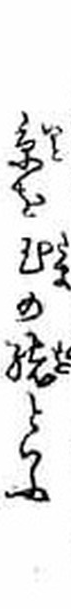糸を玉の緒といふ康

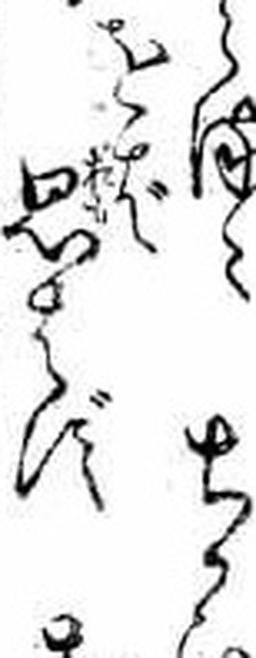思はず
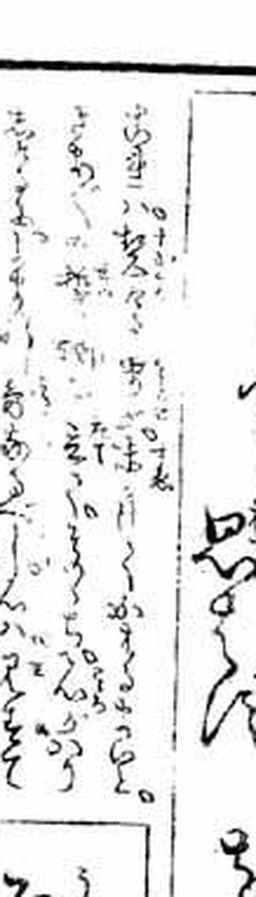これは契ける男が末かけてかはるまいと
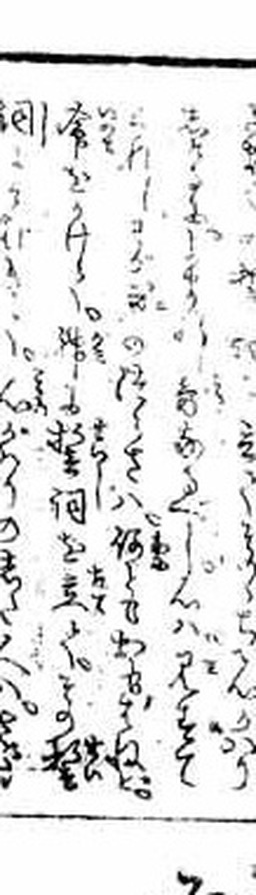られしわが身のつらさは何ともおもはねど近
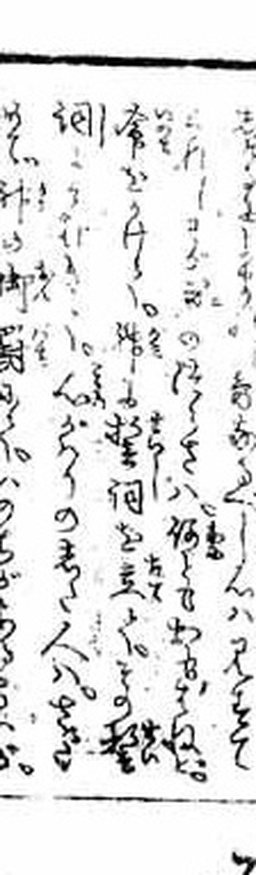命をかけて神に誓詞を立てその誓
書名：小倉百人一首
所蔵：東京学芸大学教育コンテンツアーカイブ
